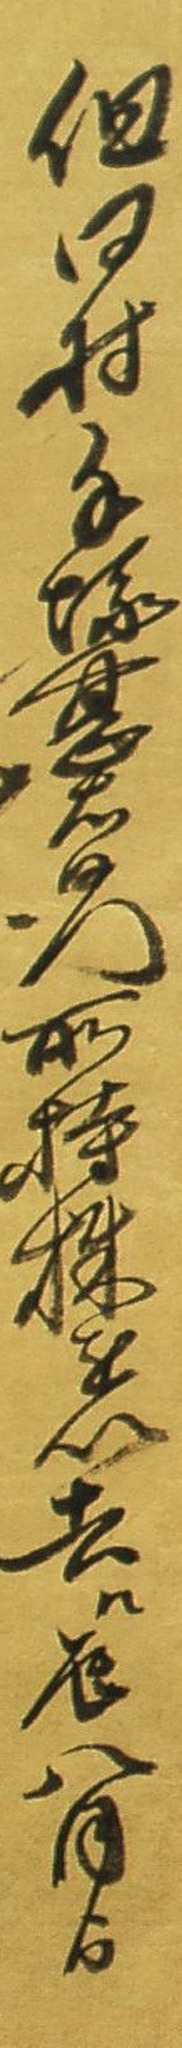但同村手塚甚右衛門所持株を以去る辰八月より
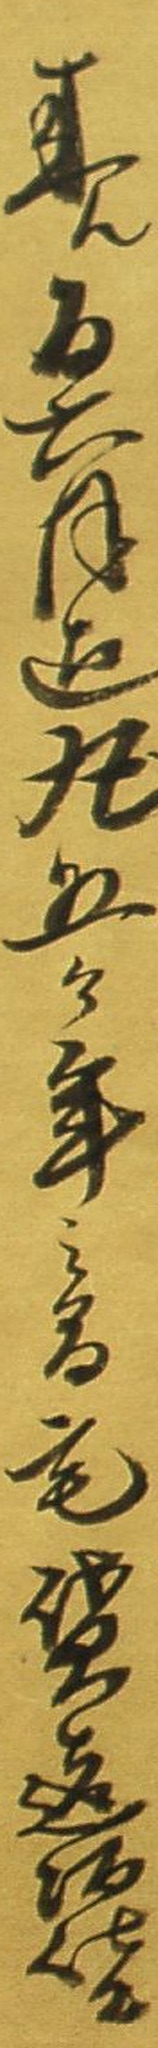来る酉六月迄丸五ヶ年之間宅貸造酒仕候

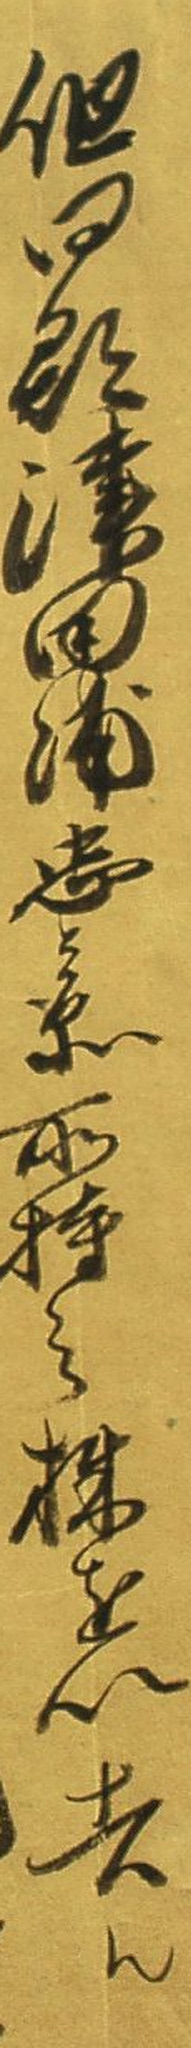但同郡津田浦忠兵衛所持之株を以去る
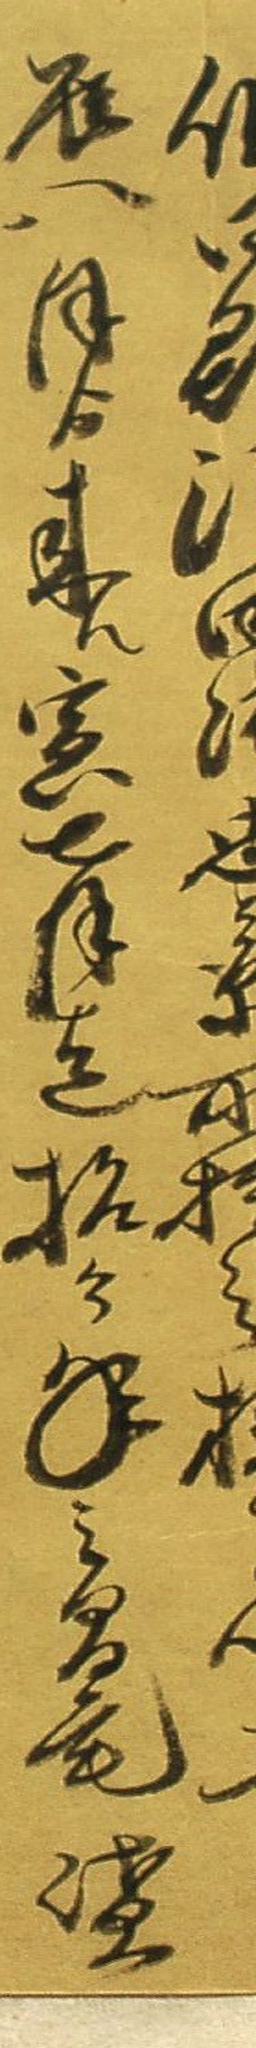辰八月より来る寅七月迄丸十ヶ年之間宅貸
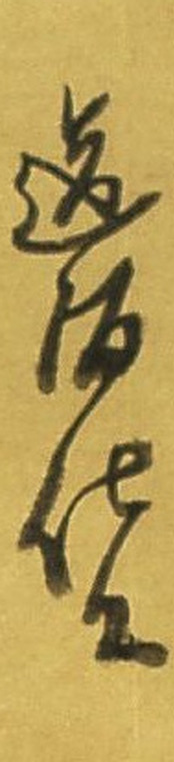造酒仕候
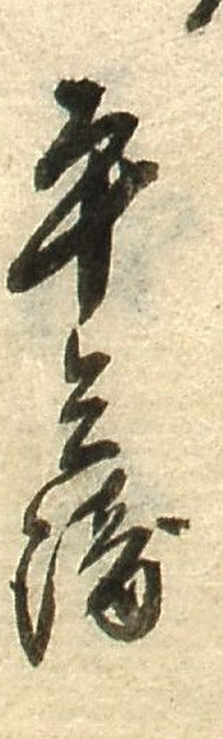平兵衛
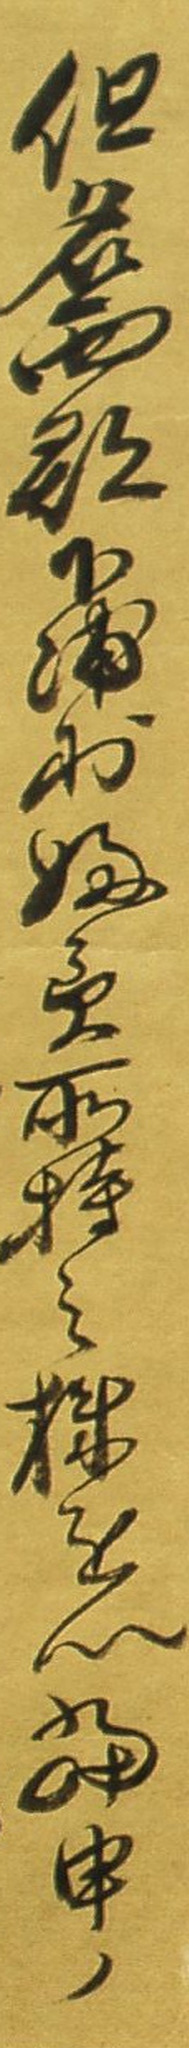但名西郡下浦村ふみ所持之株を以去る申の
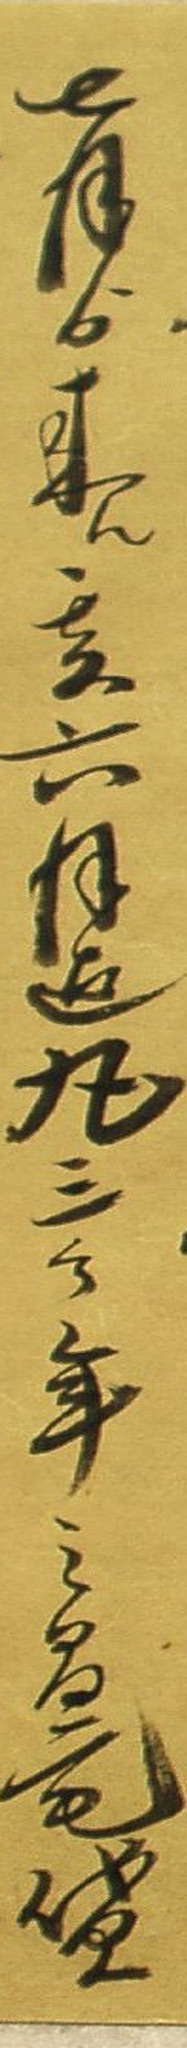七月より来る亥六月迄丸三ヶ年之間宅貸
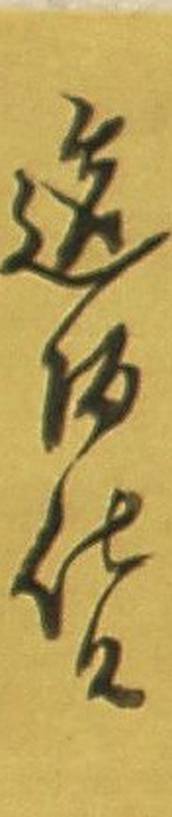造酒仕候
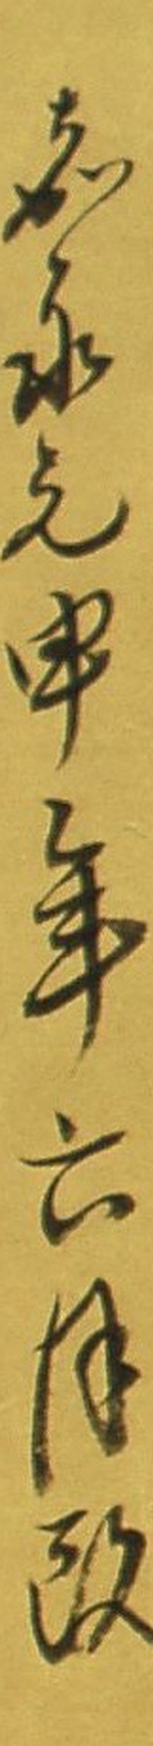嘉永元申年六月改

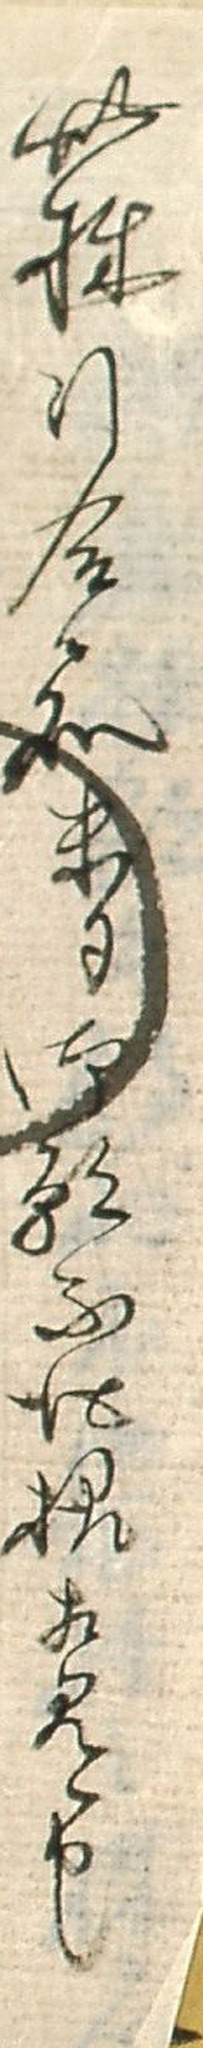此株引合候処末た御願不仕様相見へ申候
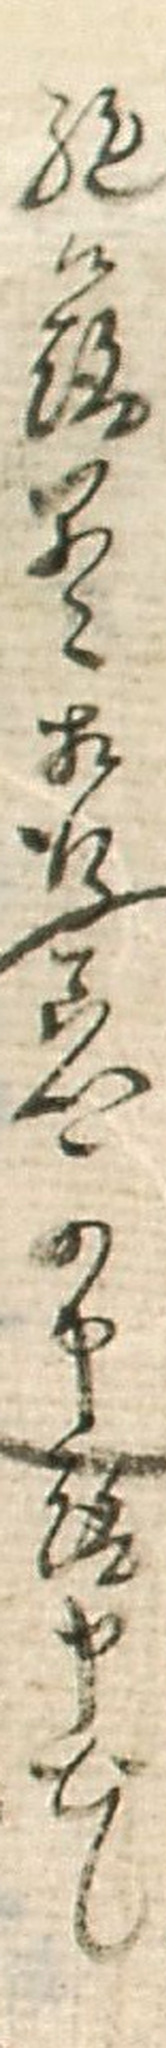候趣早々相行着可申趣申出候
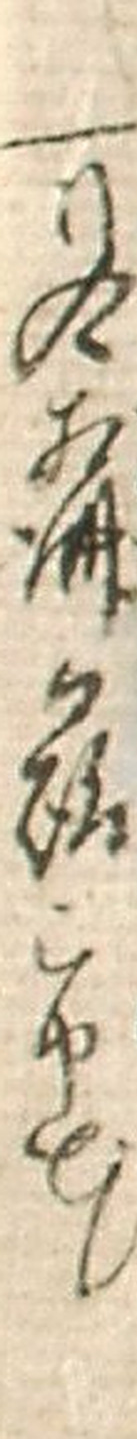引合相済候趣被申出候

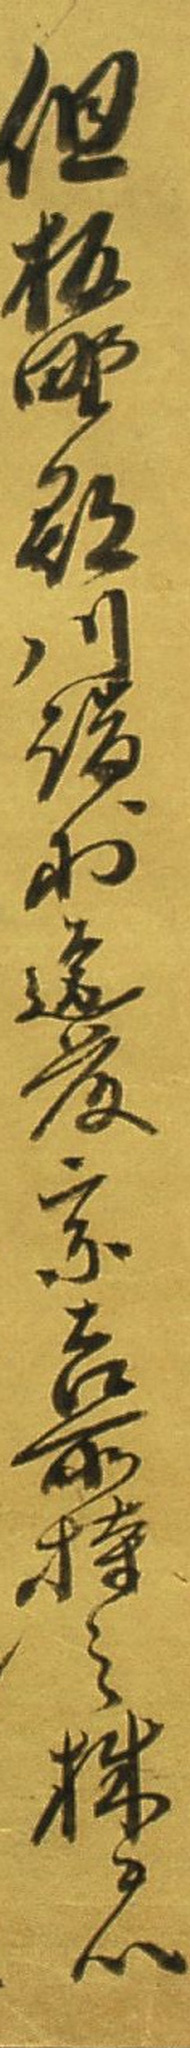但板野郡川端村遠藤宗吉所持之株を以
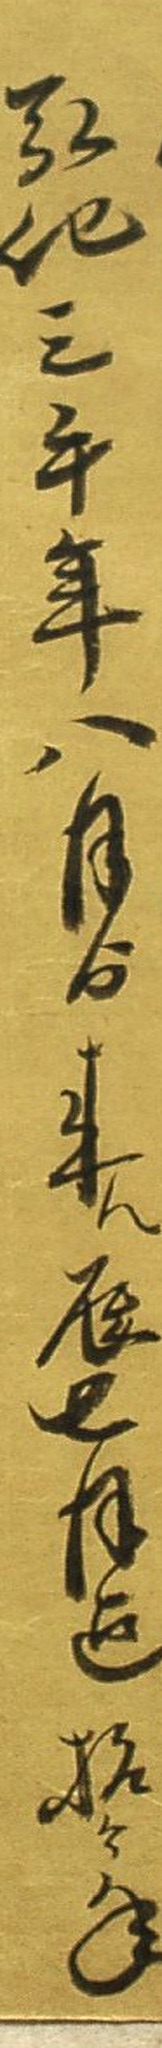弘化三午年八月より来る辰七月迄十ヶ年
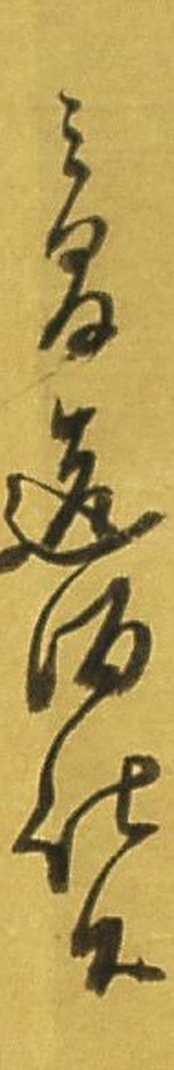之間造酒仕候
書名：名東郡中酒株並造酒屋軒数取調帳
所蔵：鳴門教育大学 Naruto University of Education
